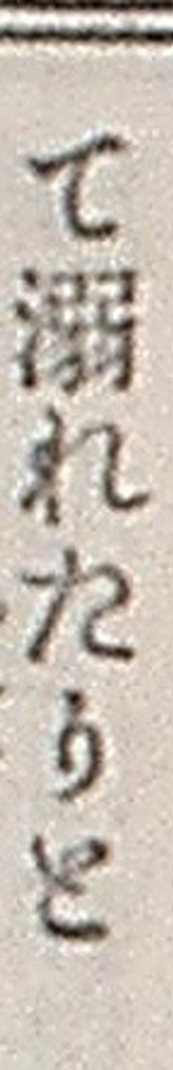て溺れたりと
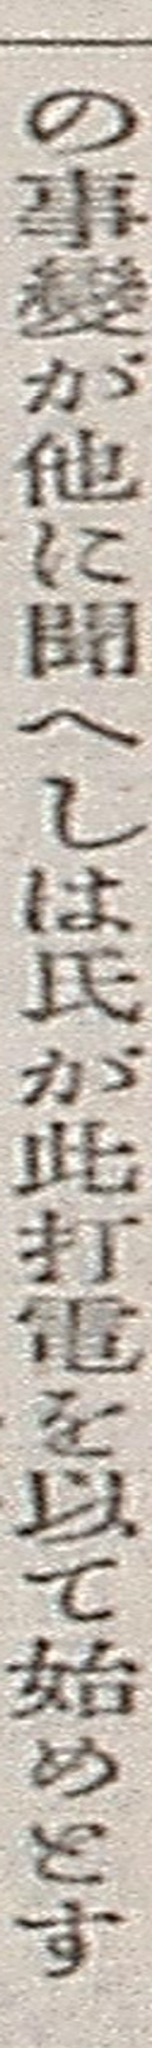の事変が他に聞へしは氏が此打電を以て始めとす
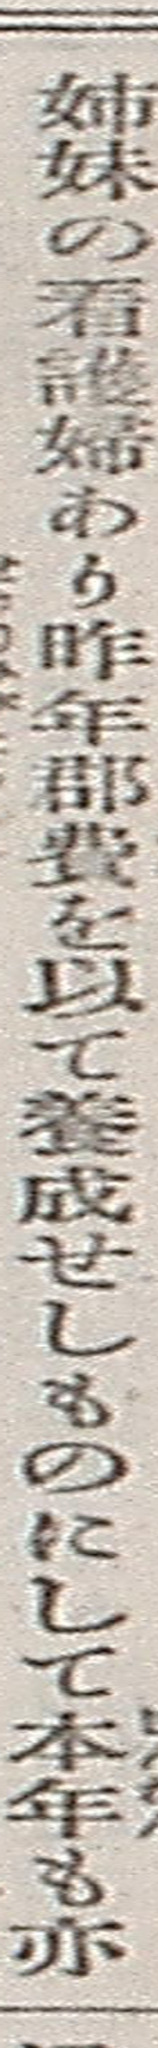姉妹の看護婦あり昨年郡費を以て養成せしものにして本年も亦
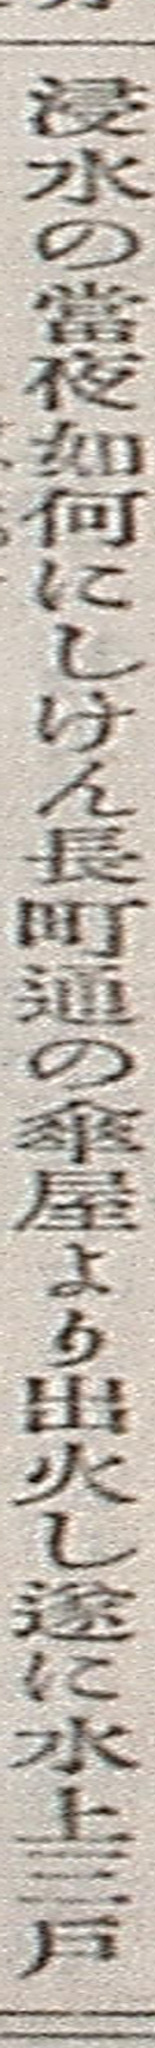浸水の当や如何にしけん長原通の傘屋より出火し遂に水上三戸
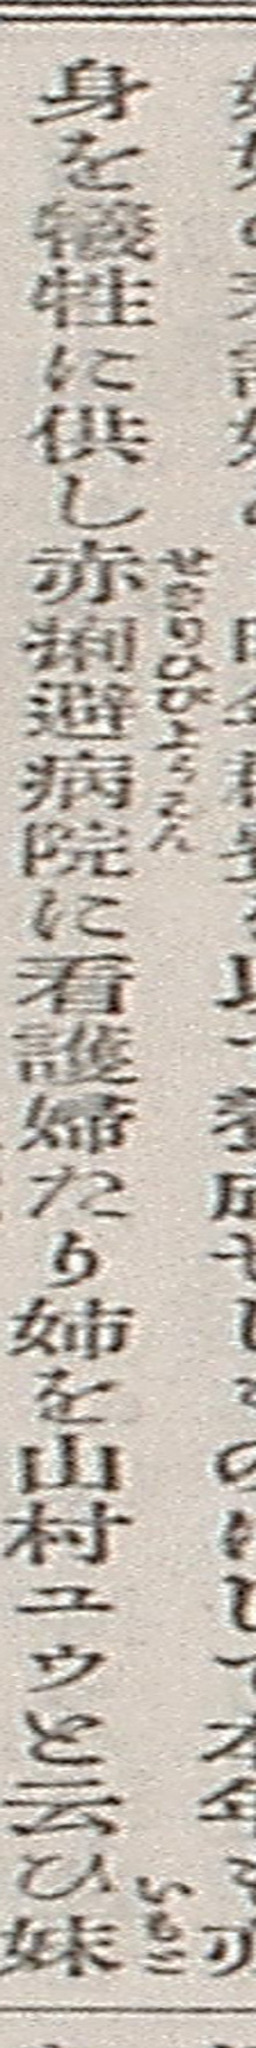身を犠牲に供し赤痢避病院に看護婦たり姉を山村ユウと云ひ妹
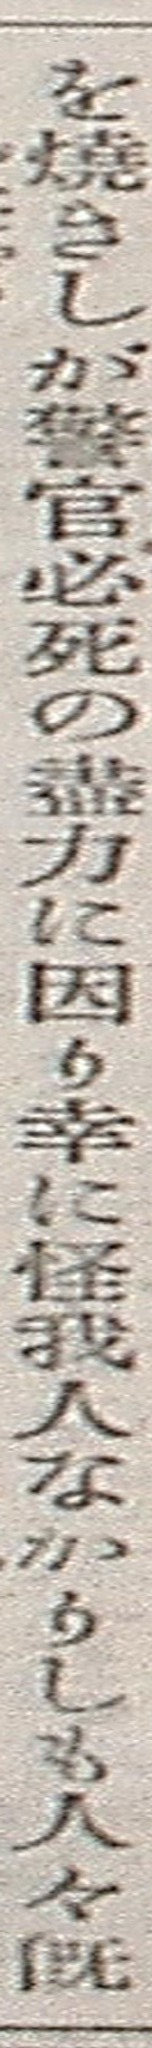を焼きしが警官必死の尽力に因り幸に怪我人なかりしも人々既
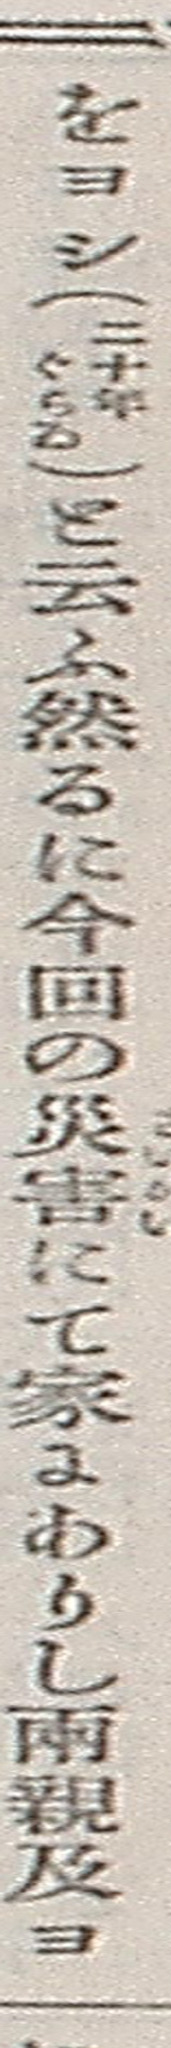をヨシと云ふ然るに今回の災害にて家にありし両親及ヨ
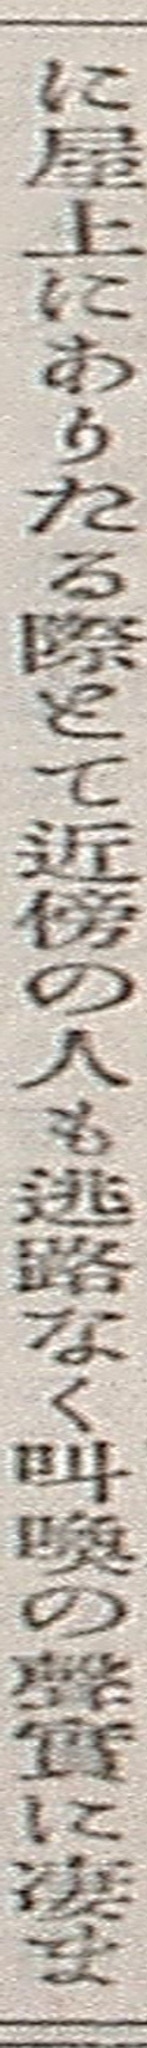に屋上にありたる際とて近傍の人も逃路泣く叫喚の声実に凄ま

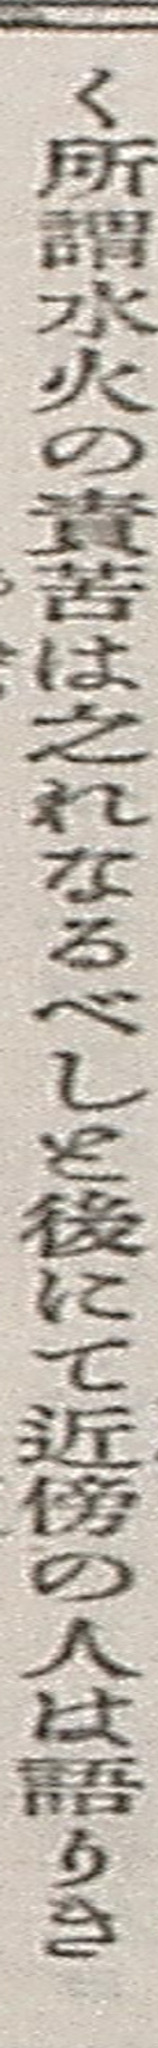く所謂水火の責苦は之れなるべしと後にて近傍の人に語りき
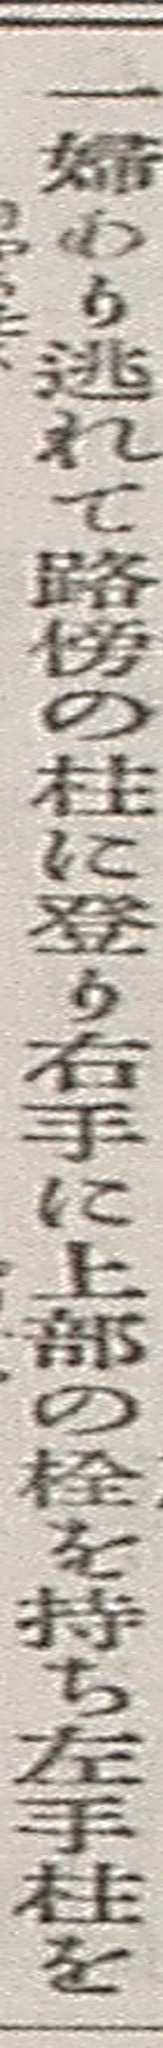一婦あり逃れて路傍の柱に登り右手に上部の栓を持ち左手柱を
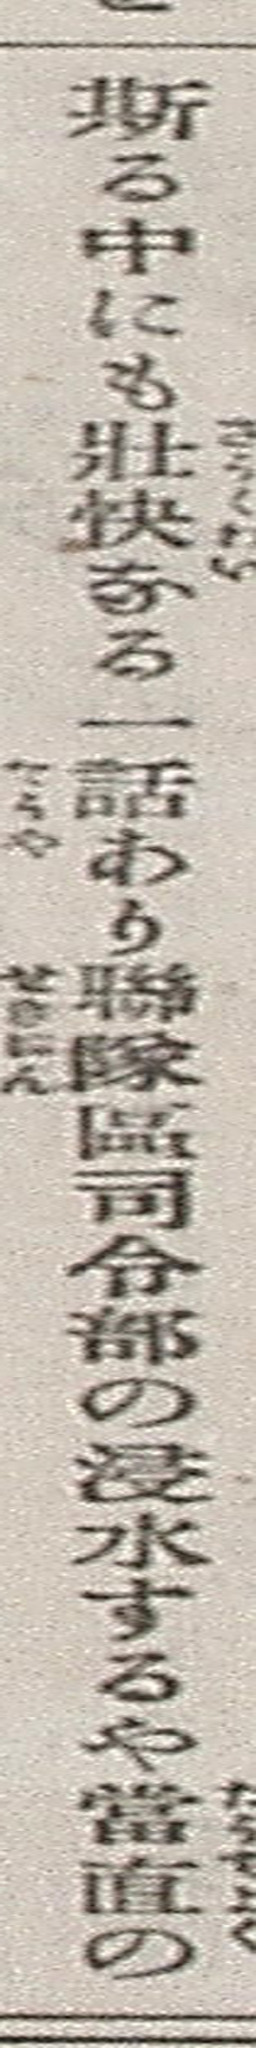斯る中にも壮快なる一話あり聯隊區司令部の浸水するや当直の
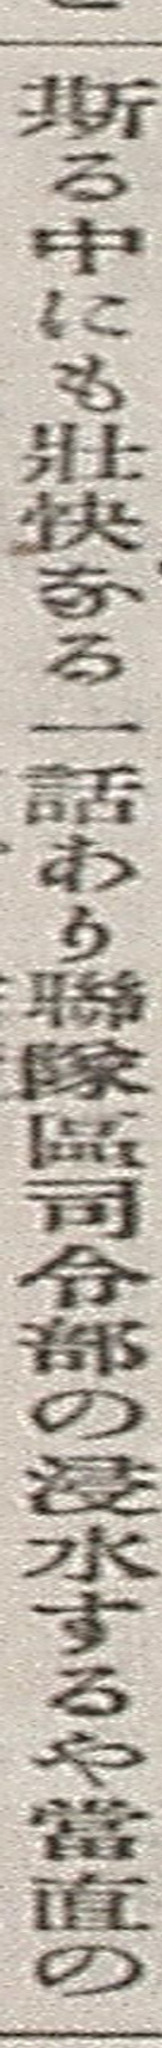斯る中にも壮快なる一話あり聯隊區司令部の浸水するや当直の
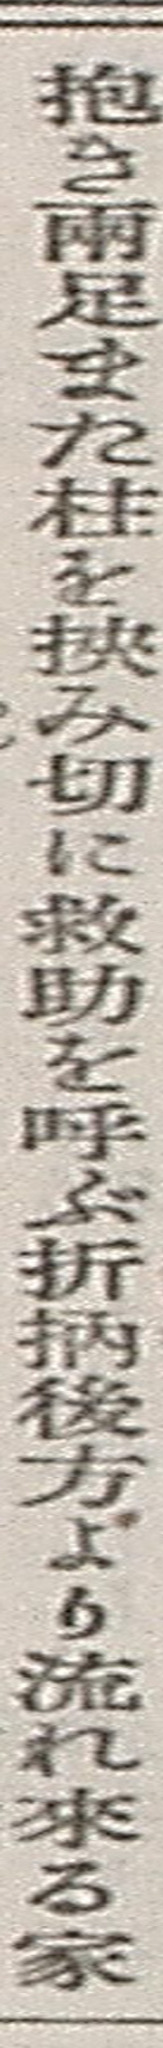抱き両足また柱を挟み切に救助を呼ぶ折柄後方より流れ来る家
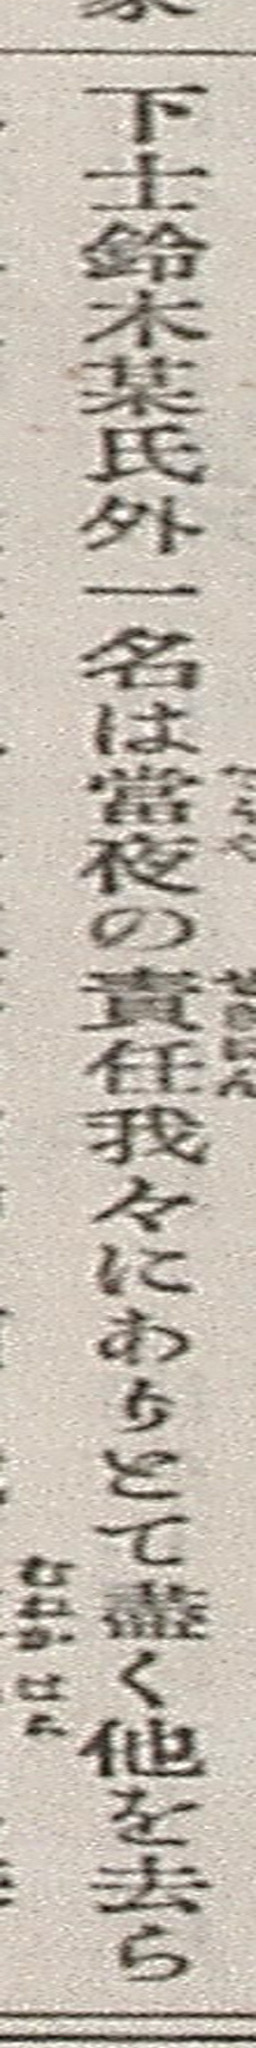下士鈴木某氏外一名は当夜の責任我々にありとて尽く他を去ら
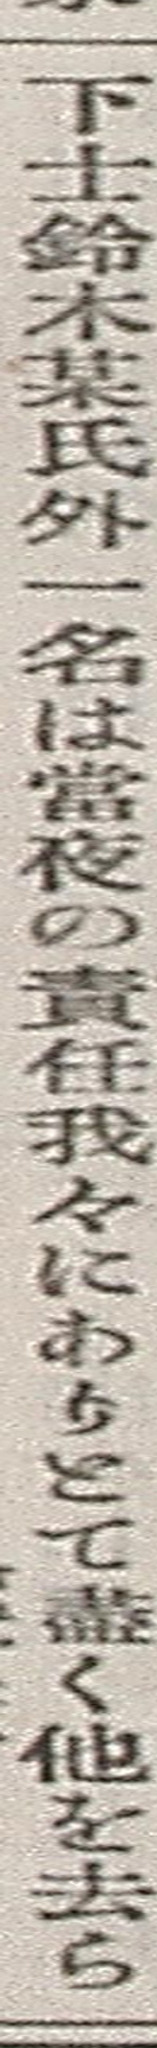下士鈴木某氏外一名は当夜の責任我々にありとて尽く他を去ら
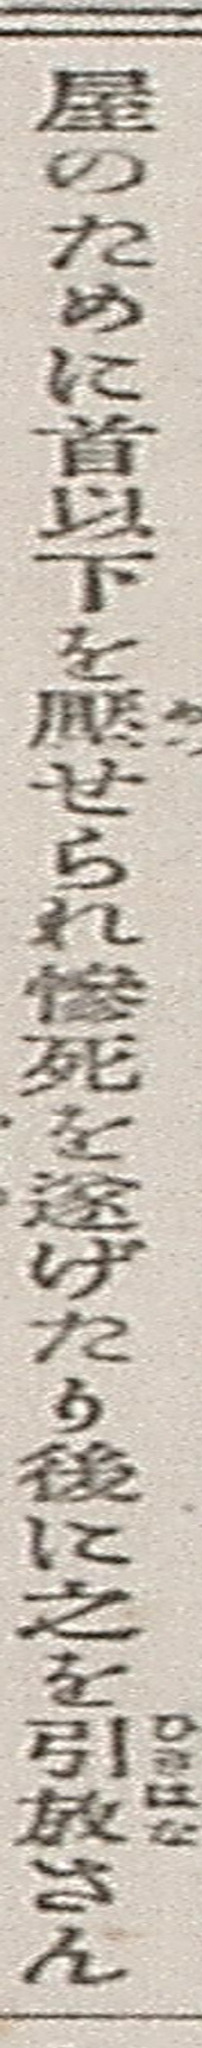屋のために首以下を壓せられ惨死遂げたり後に之を引放さん
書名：風俗畫報臨時増刊第百二十六號　洪水被害録（中）
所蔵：東京大学地震研究所図書室 Earthquake Research Institute Library, The University of Tokyo, JAPAN
